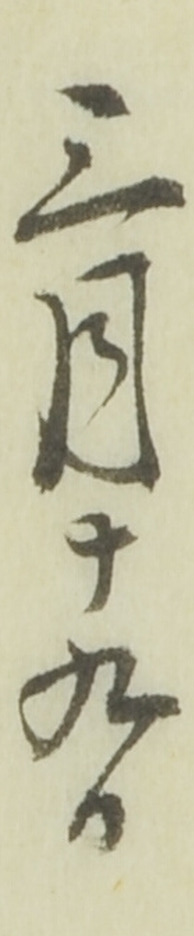三月十九日
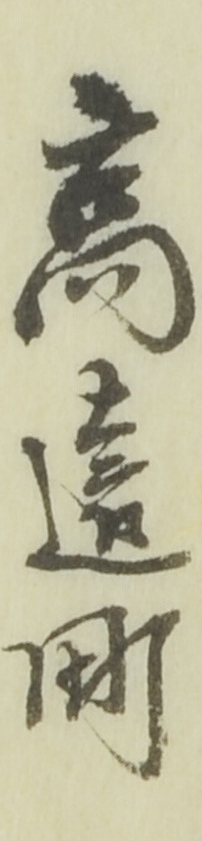高遠町
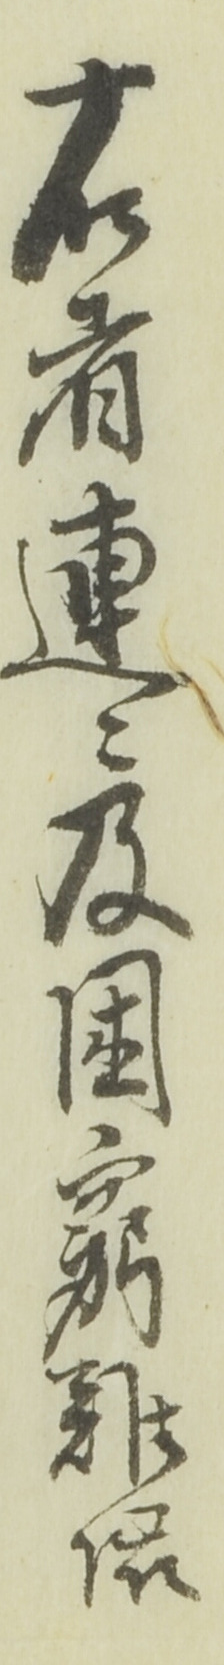右者連々及困窮難渋
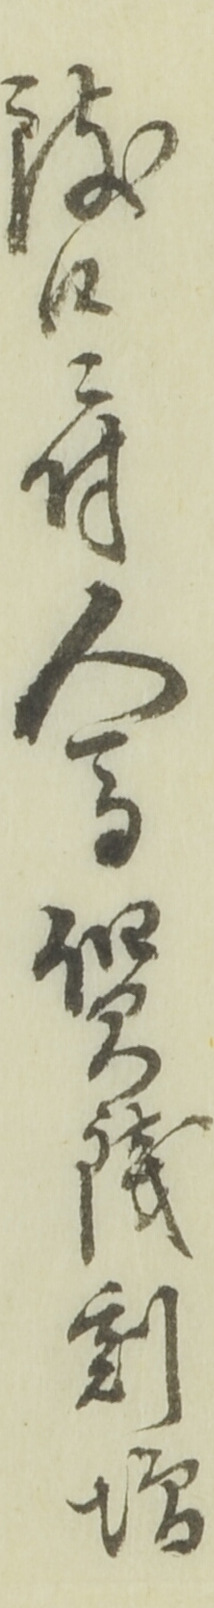致候ニ付人馬賃銭割増
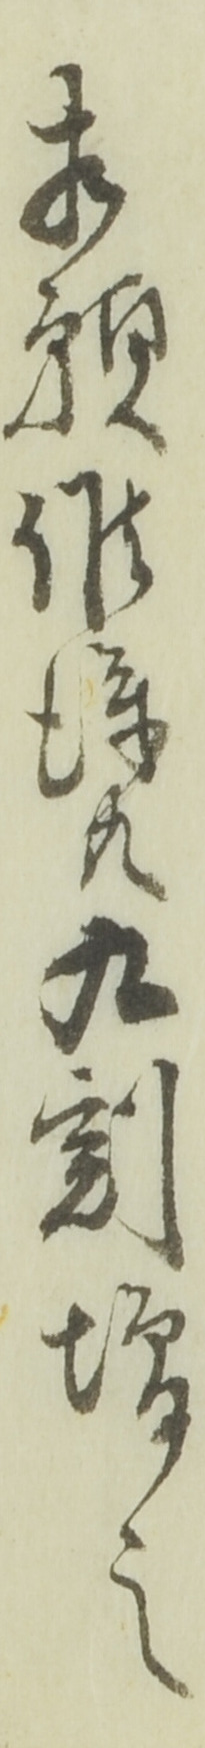相願候得共九割増之
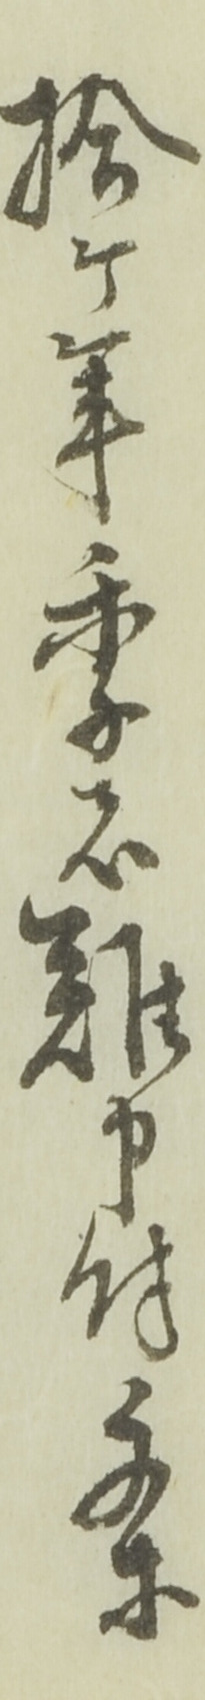拾ケ年季者難申付条
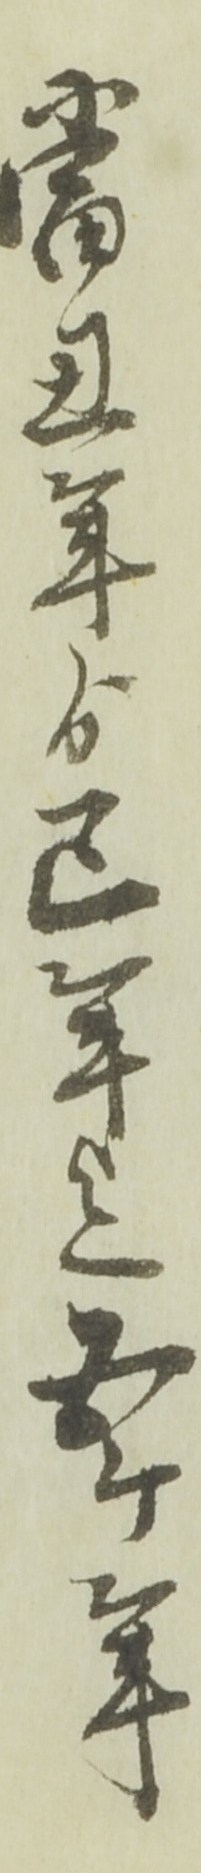当丑年ゟ巳年迄五ケ年
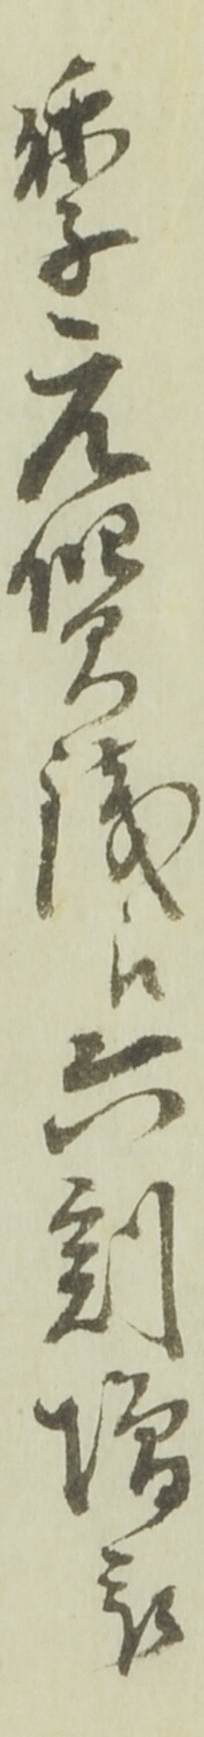季元賃銭江六割増被
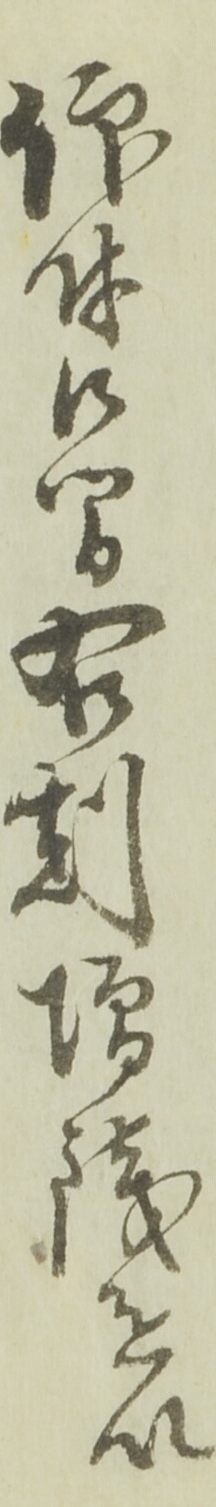仰付候間右割増銭を以
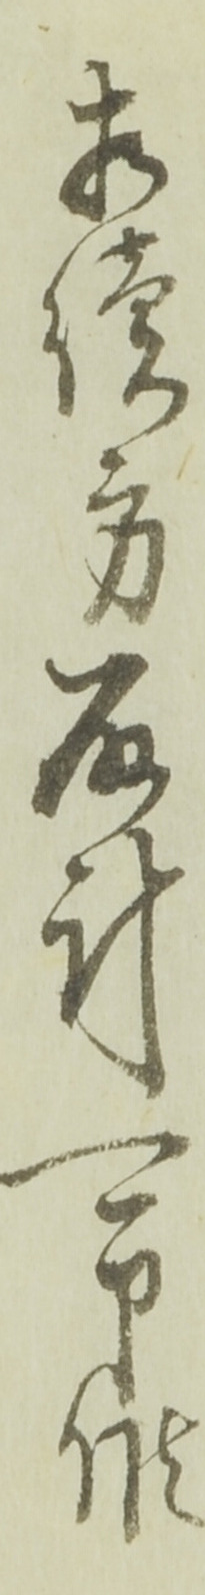相続方取斗可申候
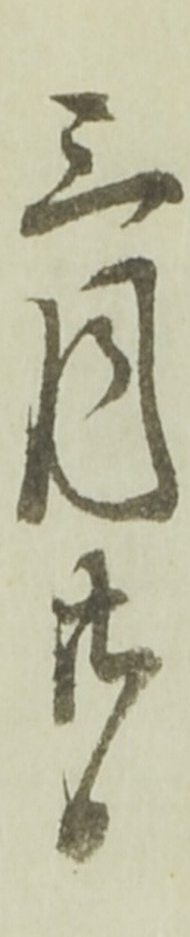三月廿日
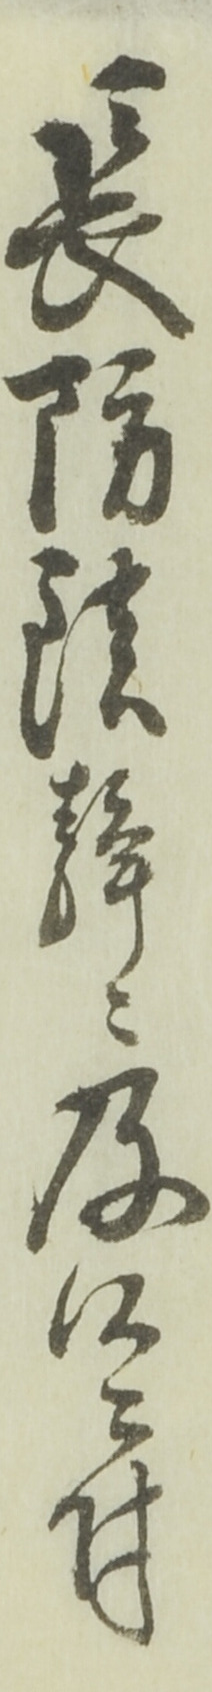長防鎮静ニ及候ニ付
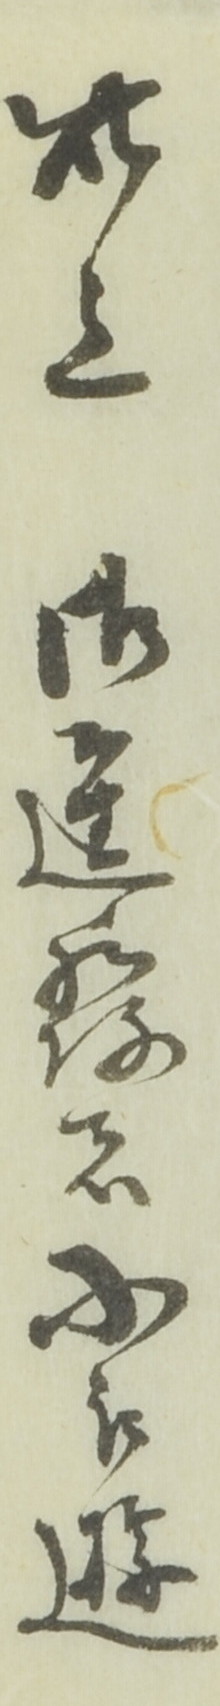此上御進発者不被遊
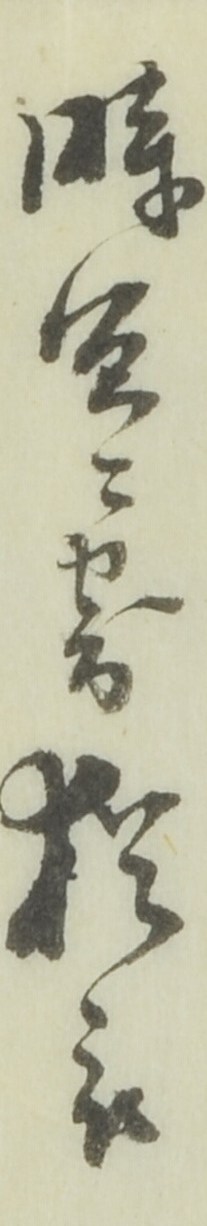時宜ニ寄猶被
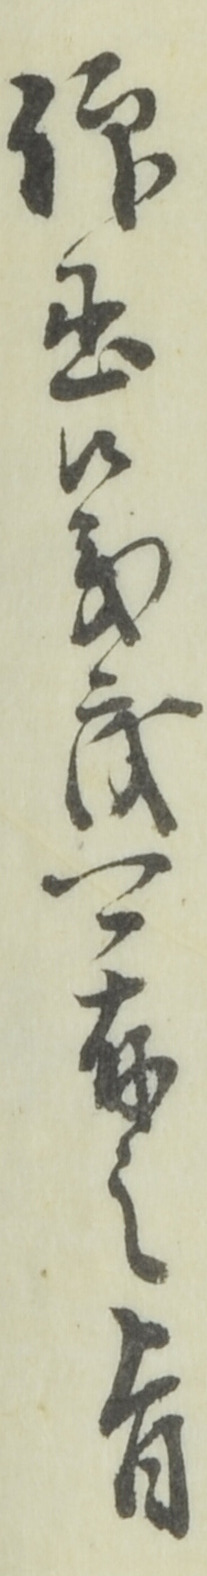仰出候義茂可存之旨

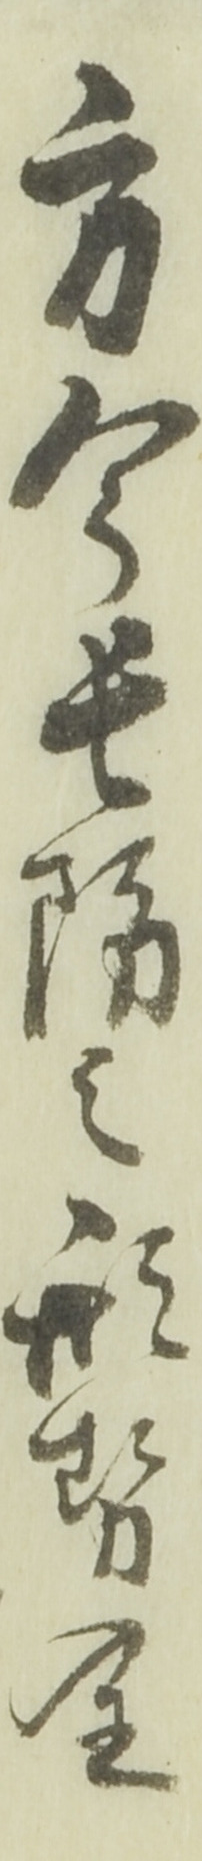方今長防之形勢全
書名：御触書御書附控帳
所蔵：伊那市立高遠町図書館・合同会社AMANE
